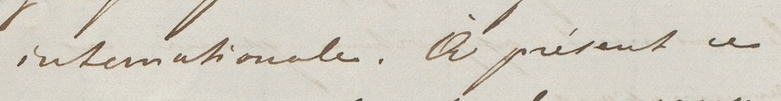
internationale. À présent ce
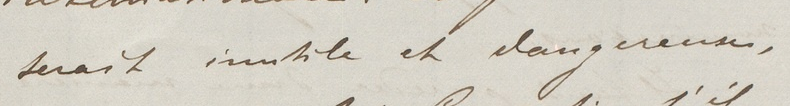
serait inutile et dangereuses,
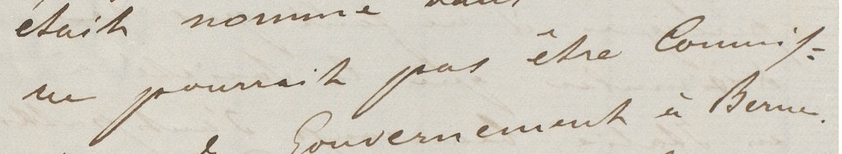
ne pourrait pas être Commis-
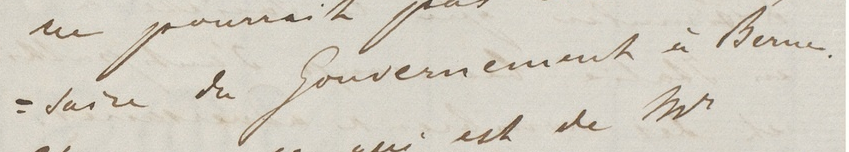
saire du Gouvernement à Berne.
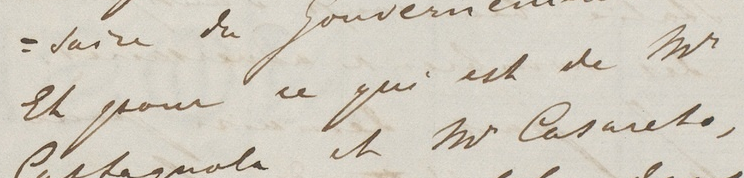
Et pour ce qui est de Mr
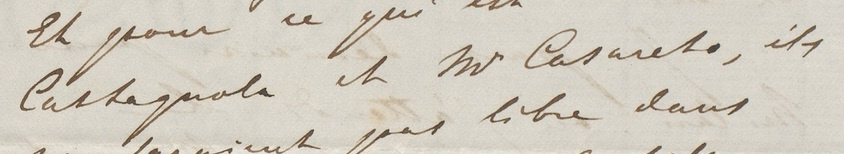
Castagnola et MrCasareto, ils
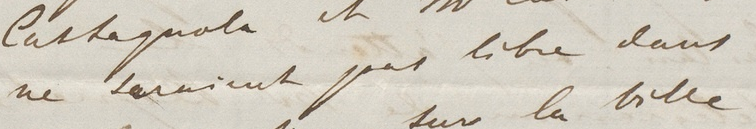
ne seraient pas libre dans
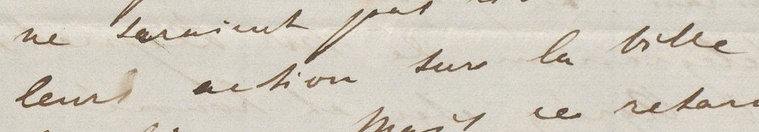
leur action sur la ville
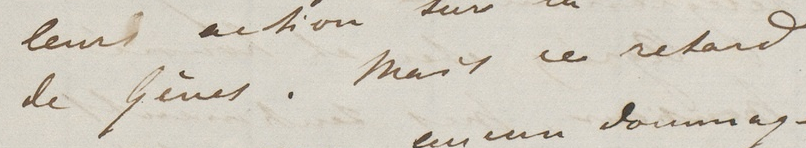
de Gênes. Mais ce retard
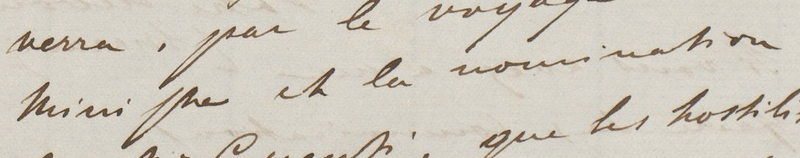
Ministre et la nomination
